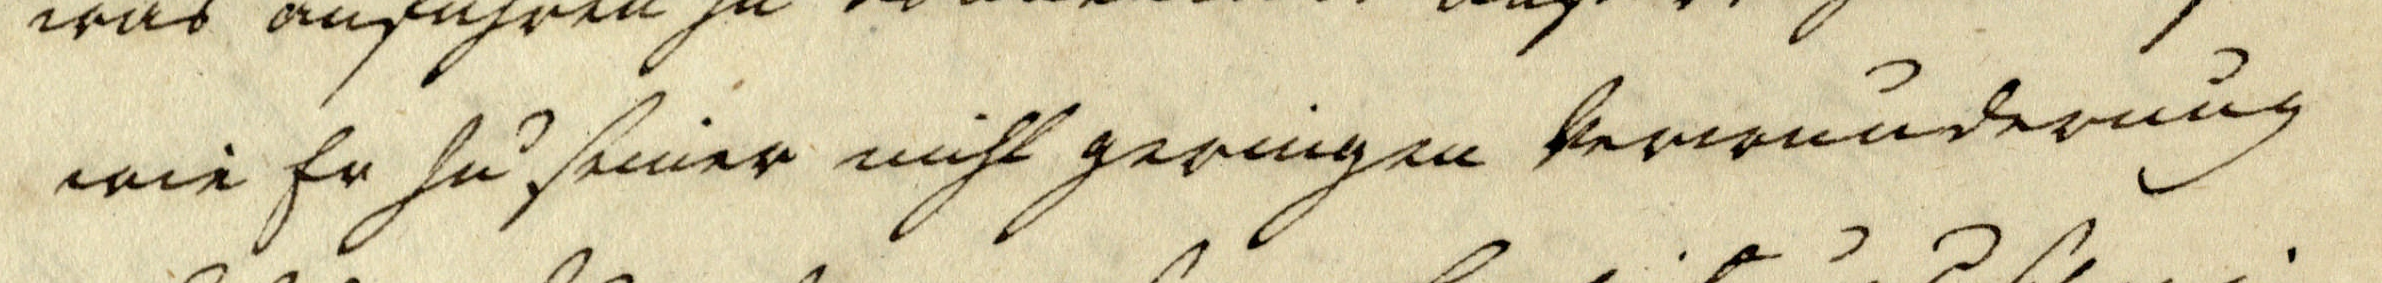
wie Er zu seiner nicht geringen Verwunderung
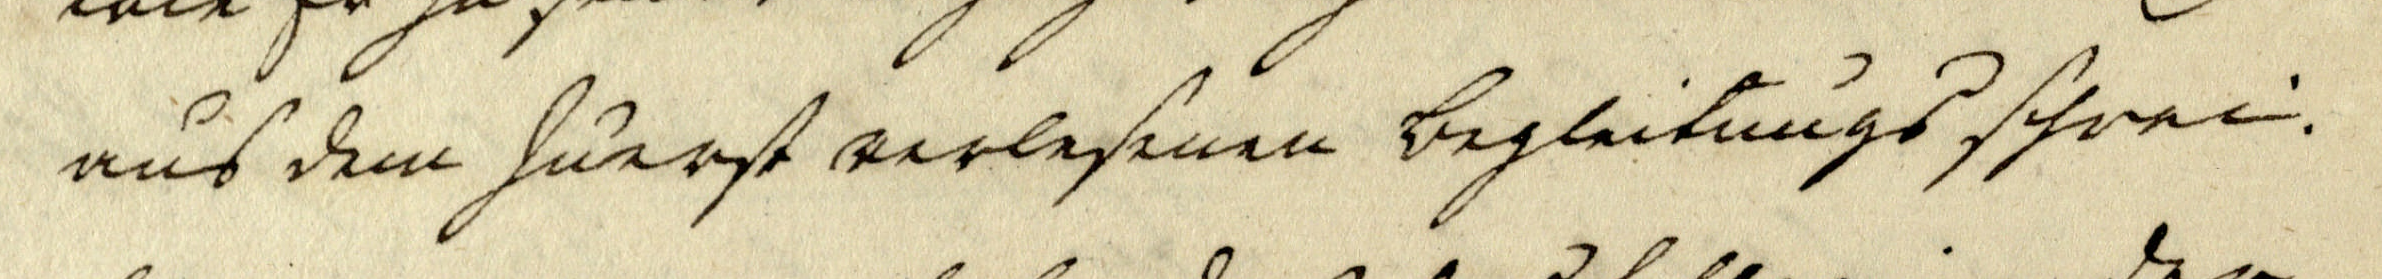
aus dem zuerst verlesenen Begleitungsschrei¬
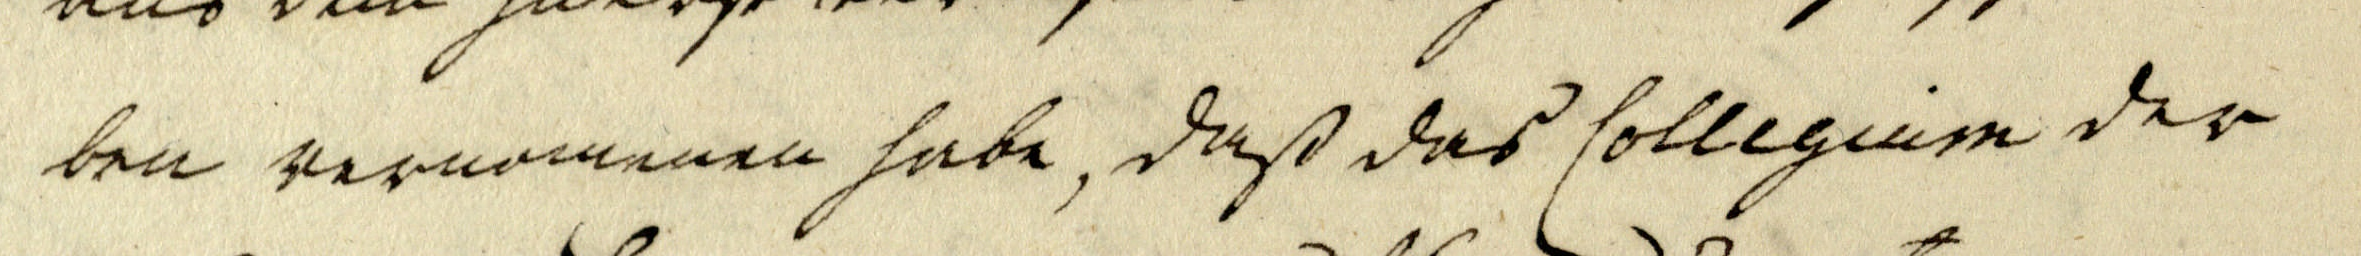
ben vernommen habe, daß das Collegium der
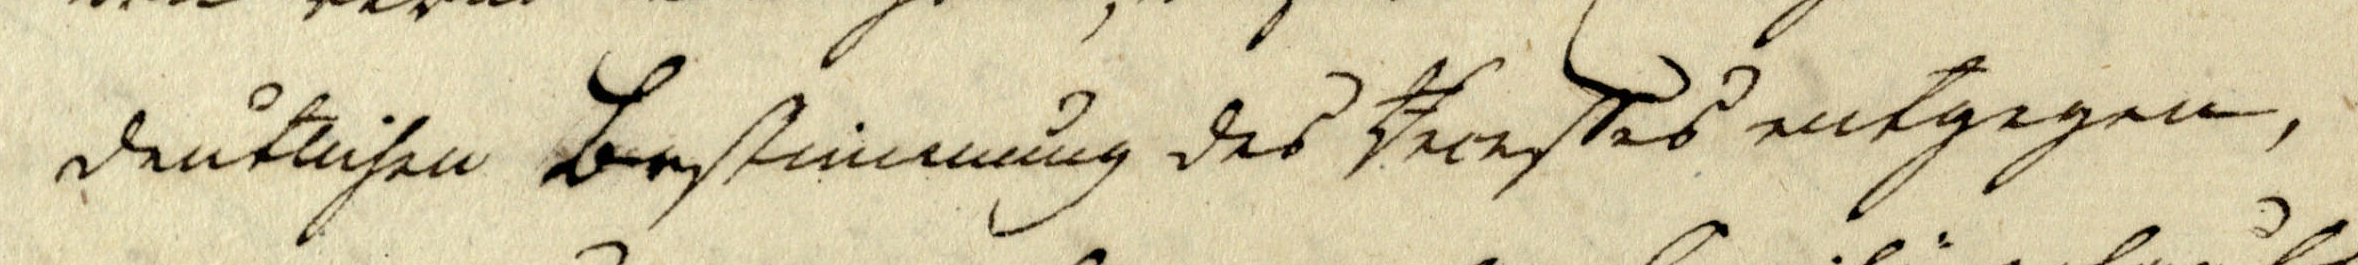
deutlichen Bestimmung des Recesses entgegen,
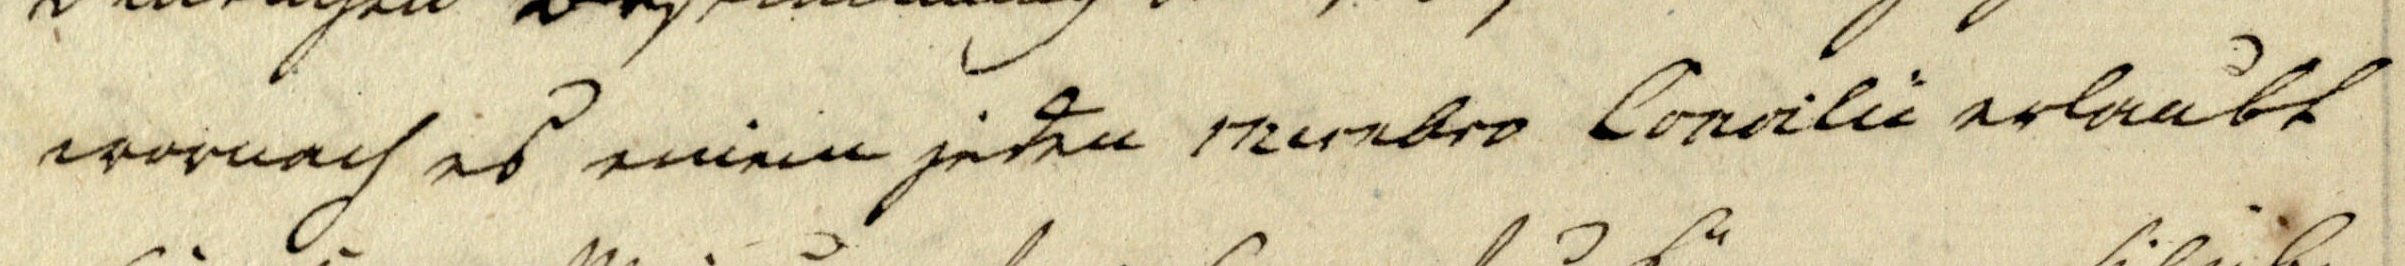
wornach es einem jeden membro Concilii erlaubt
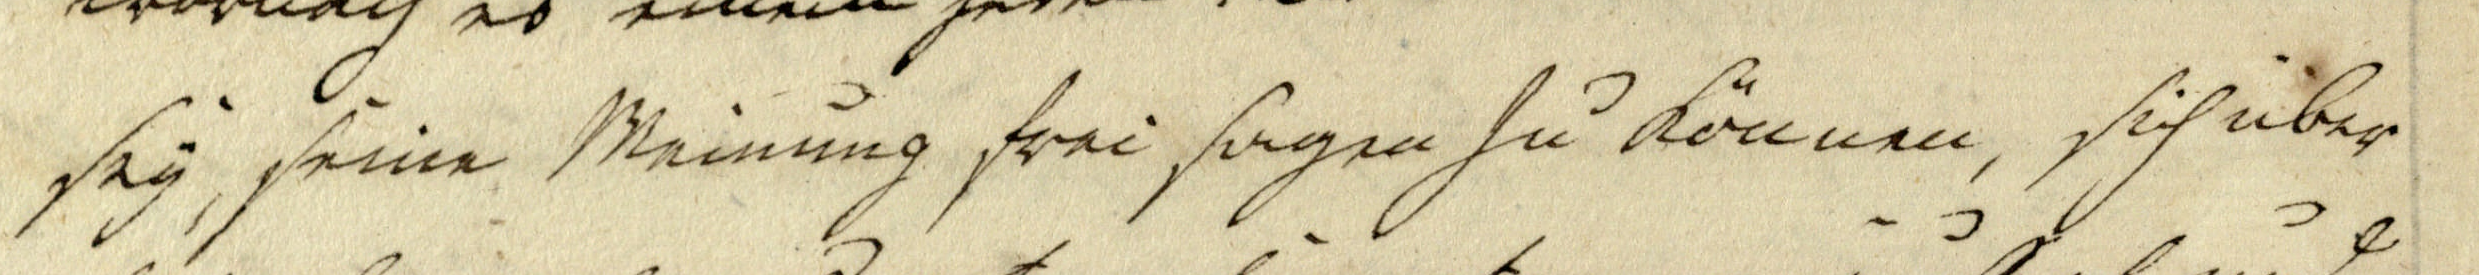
seÿ, seine Meinung frei sagen zu können, sich über
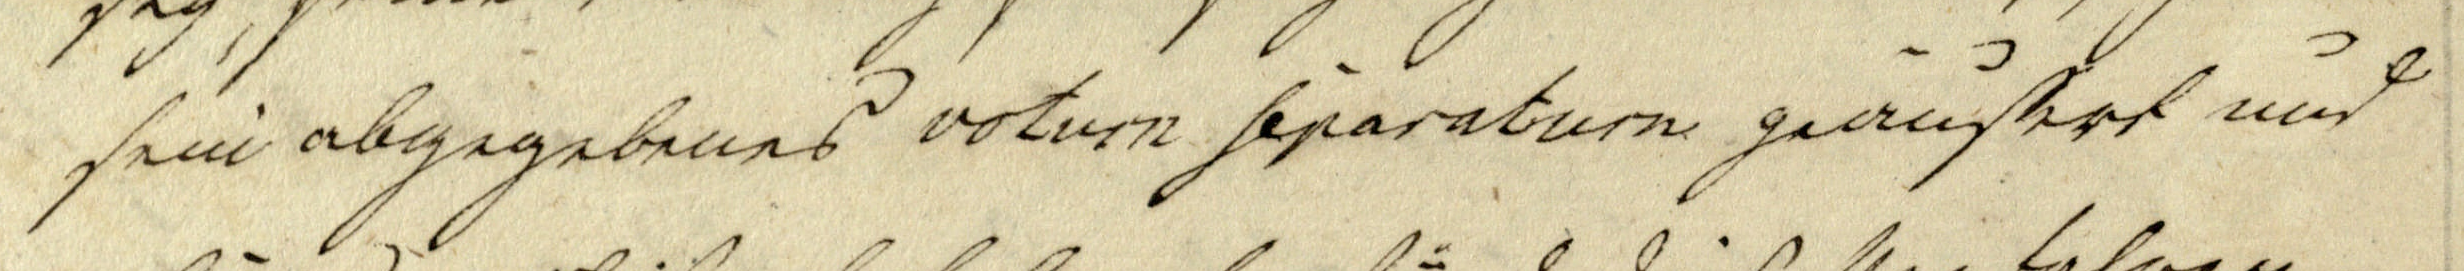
sein abgegebenes votum separatum geäussert und
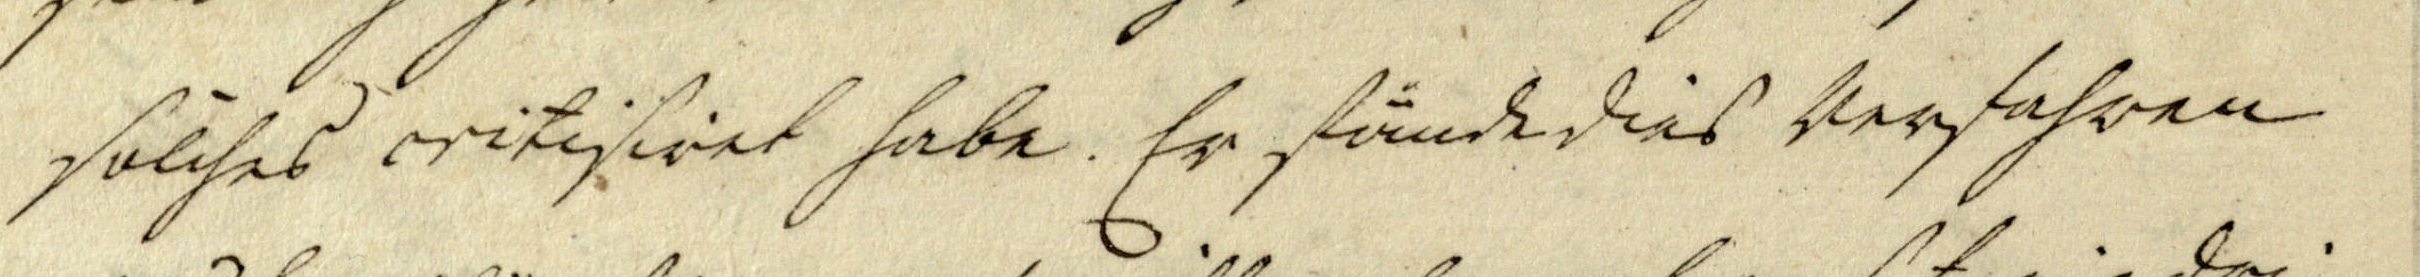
solches critisiret habe. Er fände dies Verfahren
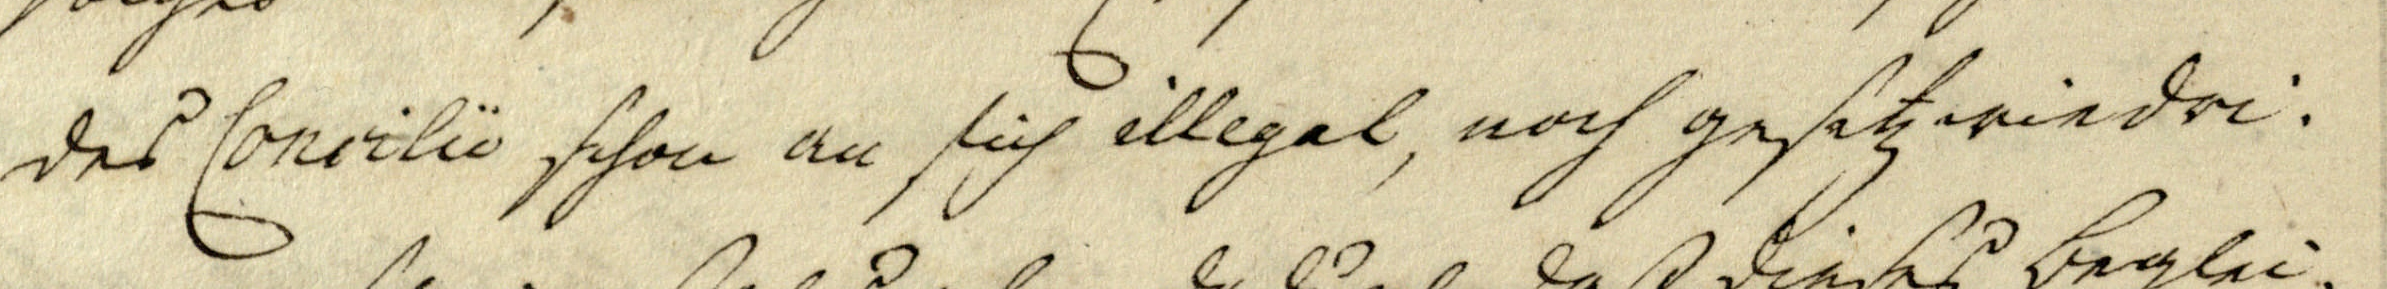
des Concilii schon an sich illegal, noch gesetzwiedri¬
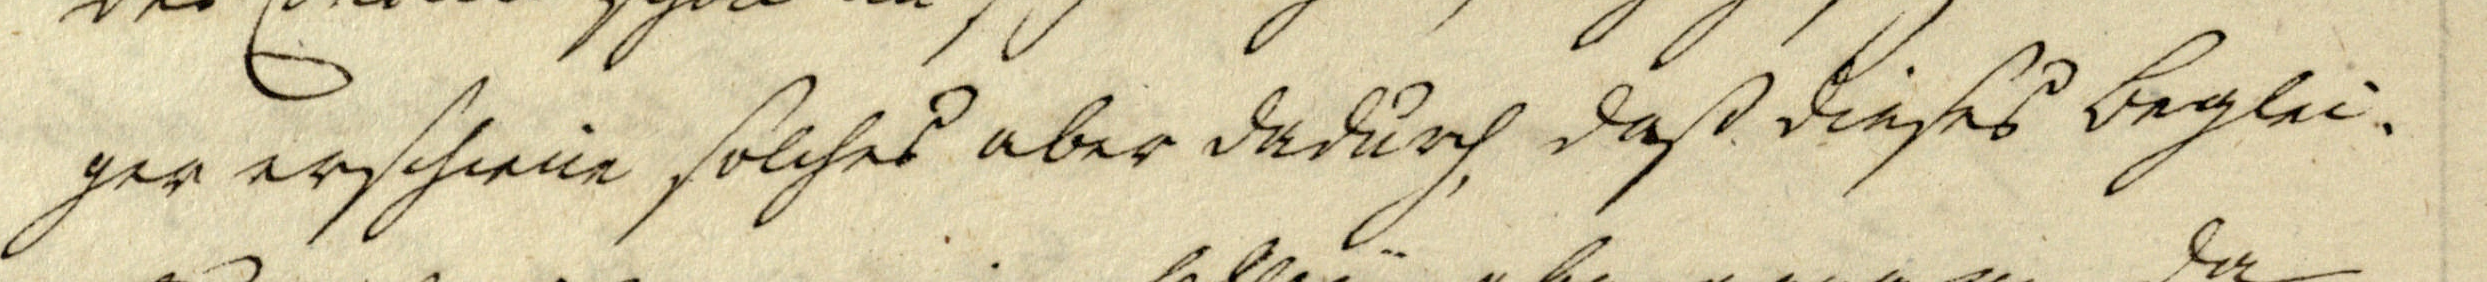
ger erschiene solches aber dadurch, daß dieses Beglei¬
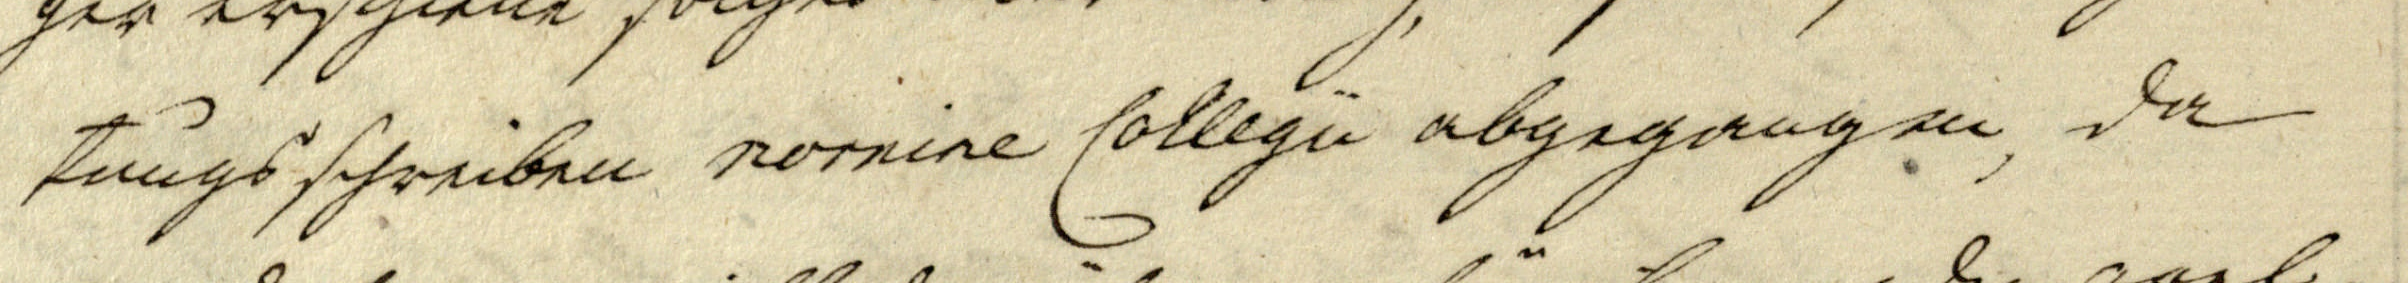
tungsschreiben nomine Collegii abgegangen, da
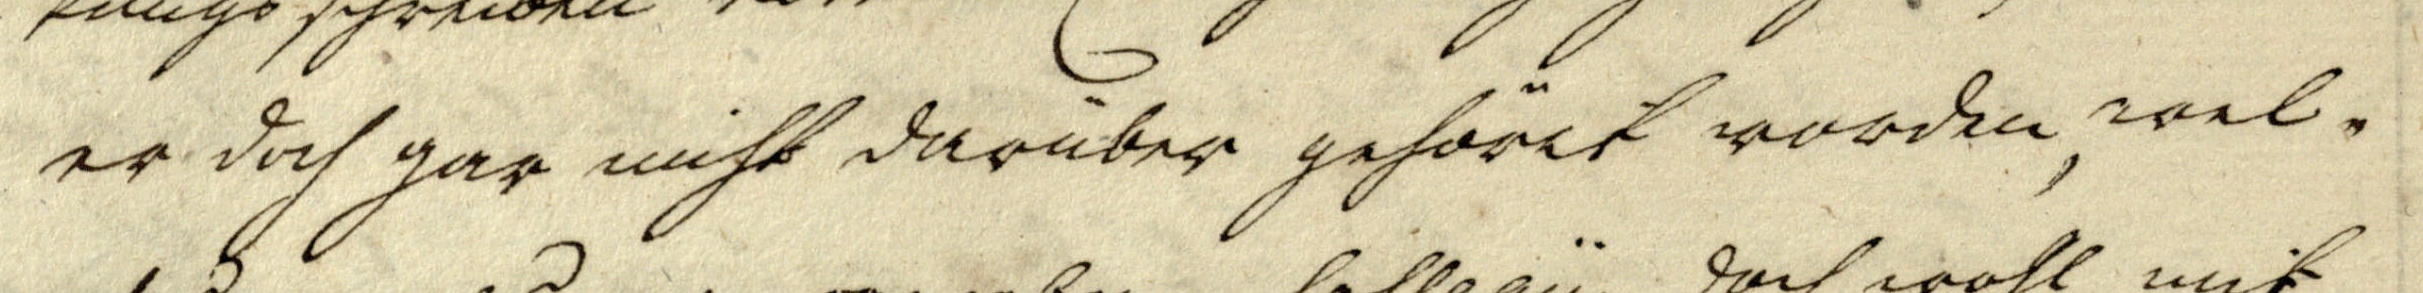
er doch gar nicht darüber gehöret worden, wel¬
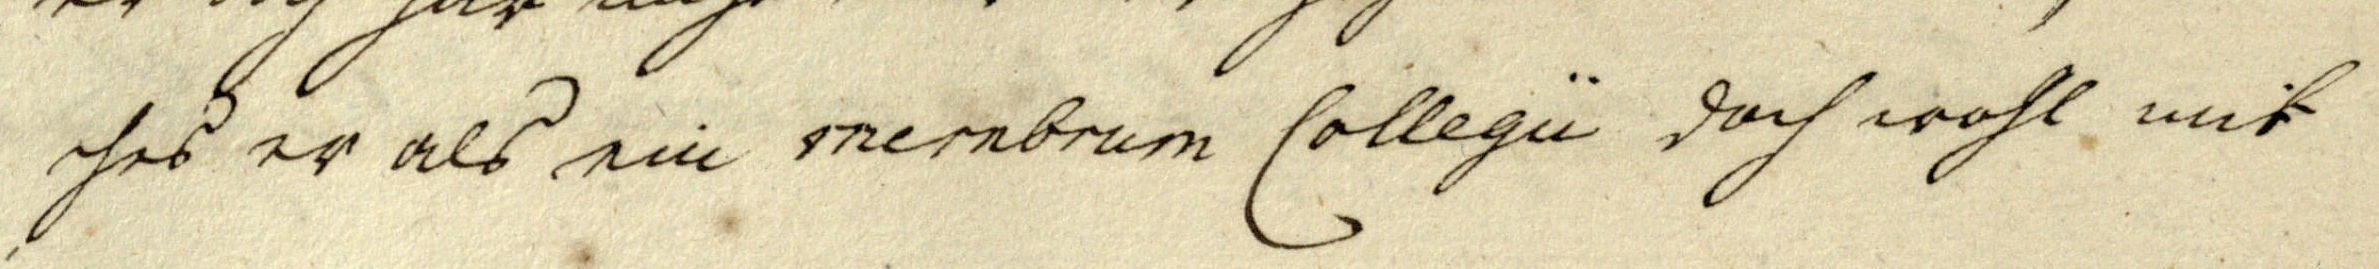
ches er als ein membrum Collegii doch wohl mit
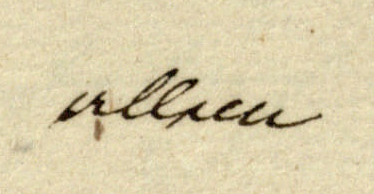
allem
